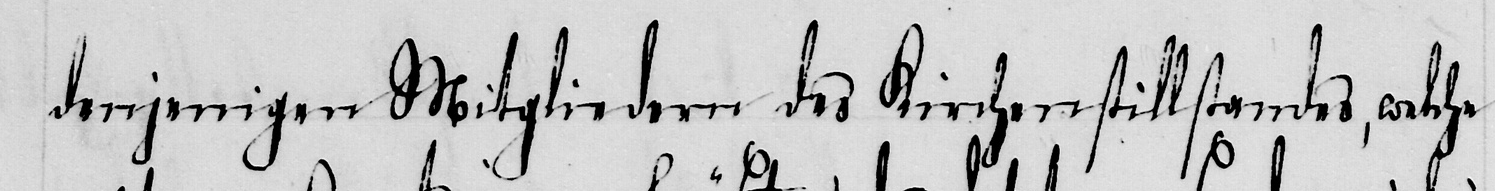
denjenigen Mitgliedern des Kirchenstillstandes, welc¬
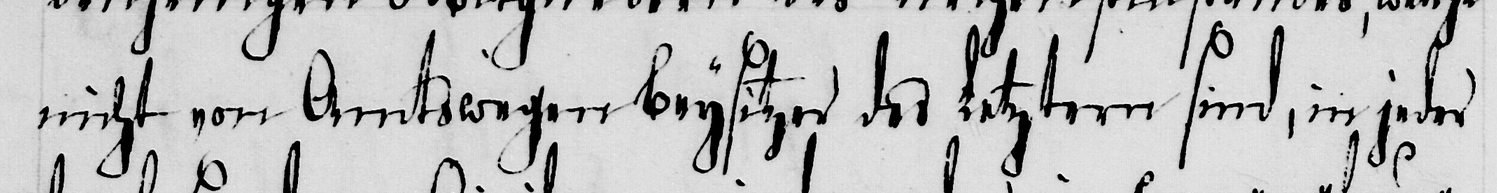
nicht von Amtswegen Beysitzer des Letztern sind, in jeder
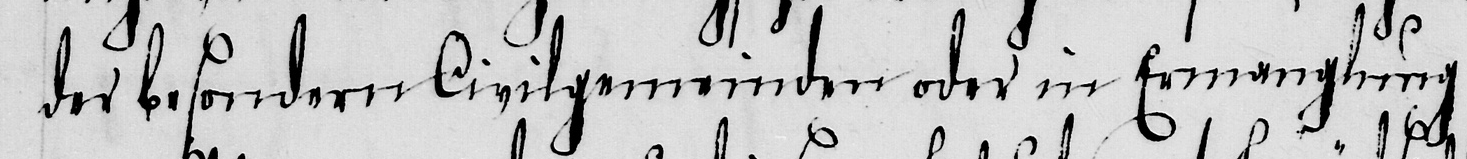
der besondern Civilgemeinden oder in Ermanglung
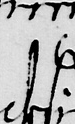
s¬
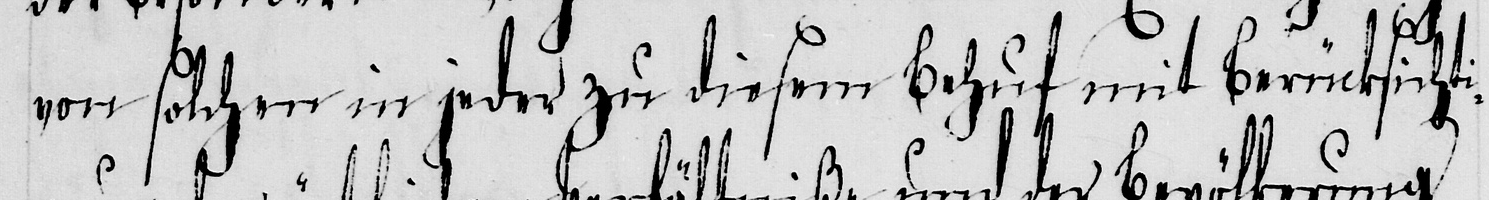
von solchen in jeder zu diesem Behuf mit Berücksicht¬
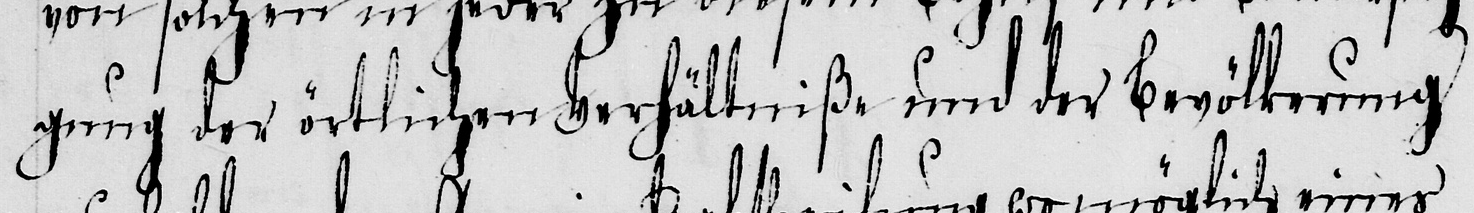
igung der örtlichen Verhältniße und der Bevölkerung
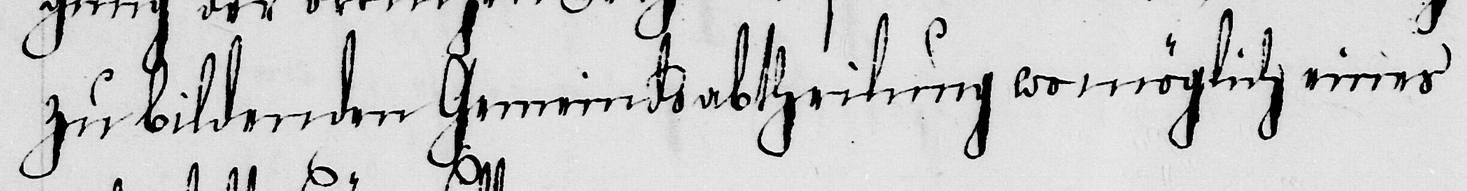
zu bildenden Gemeindsabtheilung womöglich eines
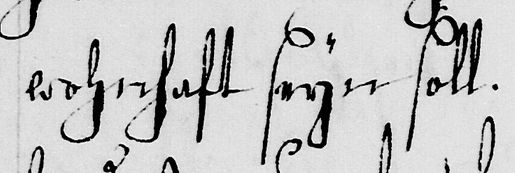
wohnhaft seyn soll.
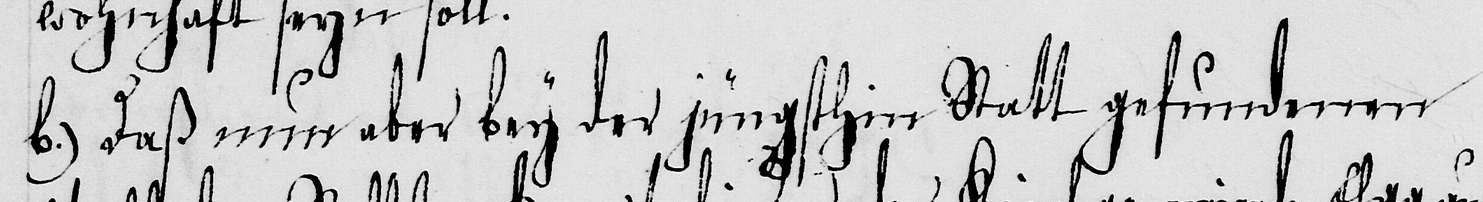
b.) Daß nun aber bey der jüngsthin Statt gefundenen
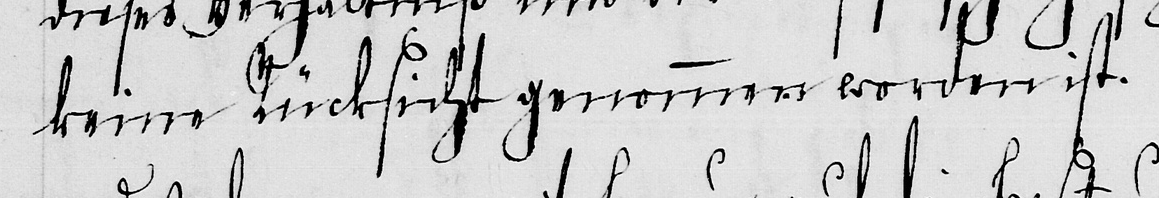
keine Rücksicht genommen worden ist.
